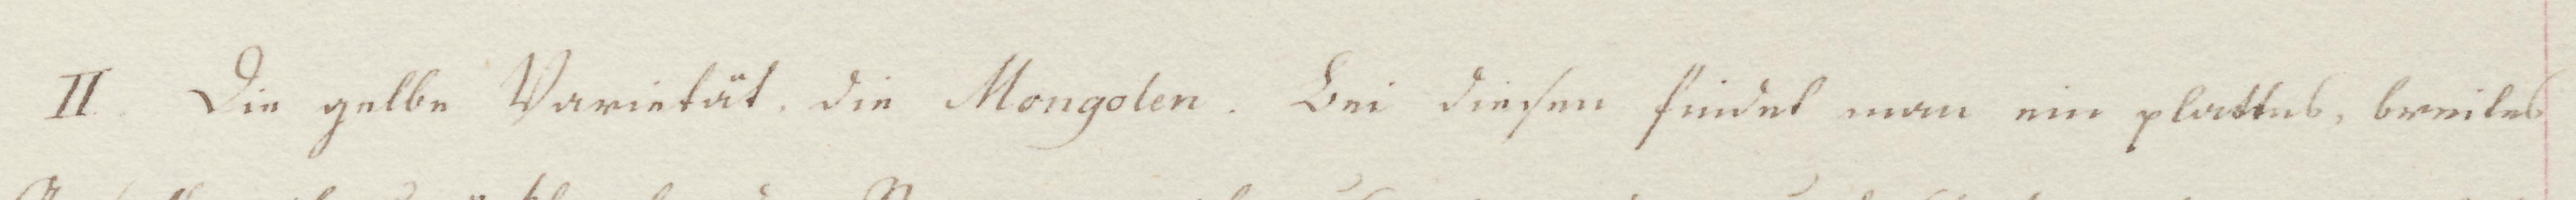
II. Die gelbe Varietät, die Mongolen. Bei diesen findet man ein plattes, breites
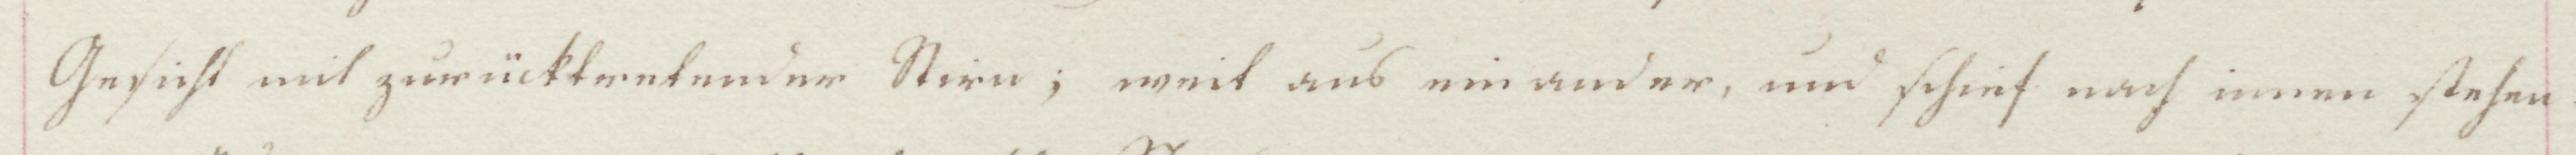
Gesicht mit zurücktretender Stirn; weit aus einander, und schief nach innen stehen-
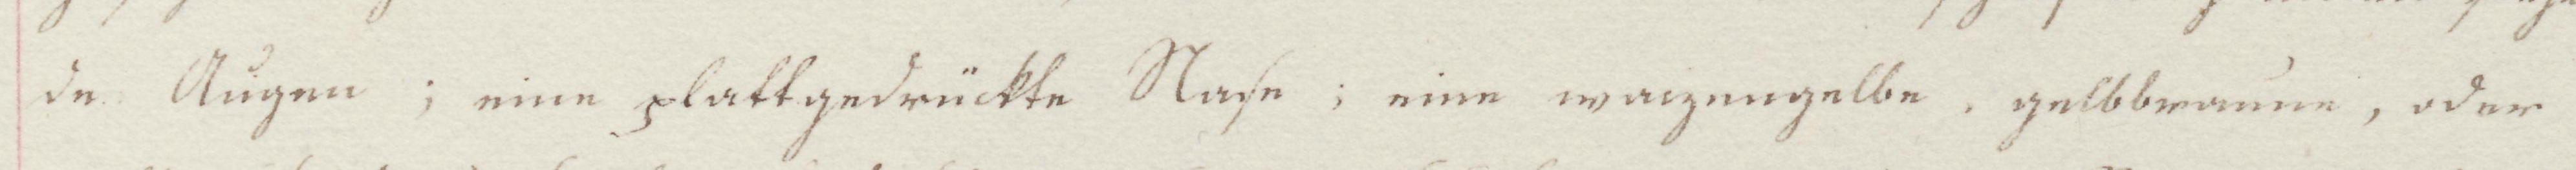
de Augen; eine plattgedrückte Nase; eine waizengelbe, gelbbraune, oder
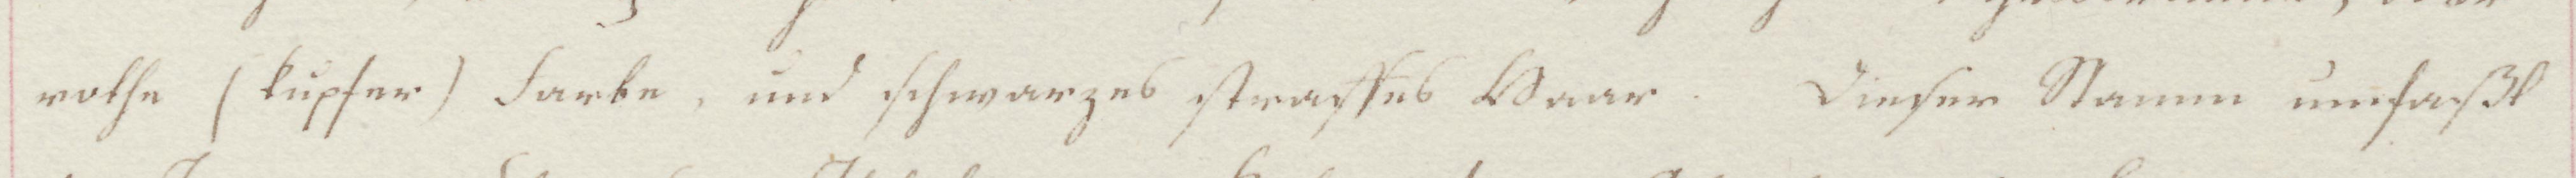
rothe Farbe, und schwarzes straffes Haar. Dieser Stamm umfaßt
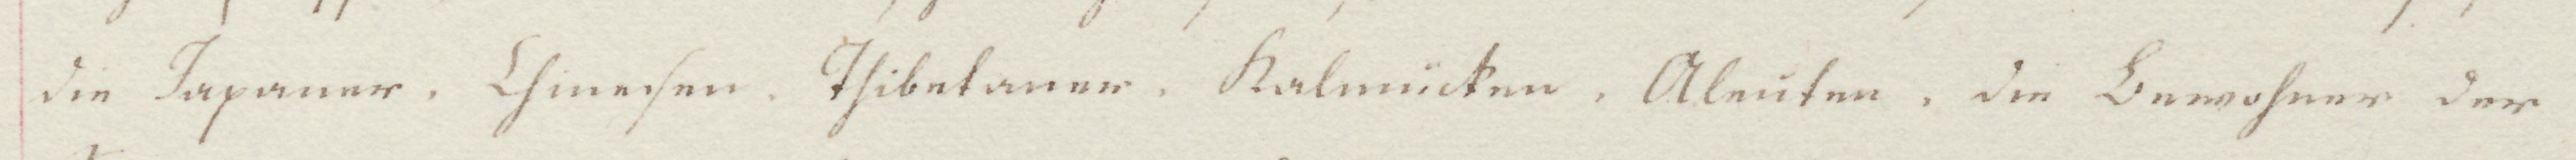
die Japaner, Chinesen, Thibetaner, Kalmücken, Aleuten, die Bewohner der
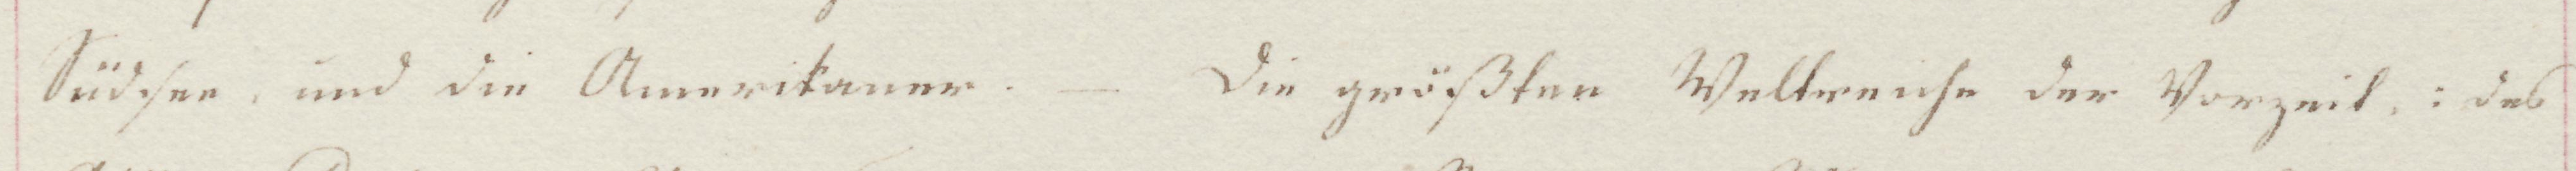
Südsee, und die Amerikaner. – Die größten Weltreiche der Vorzeit: des
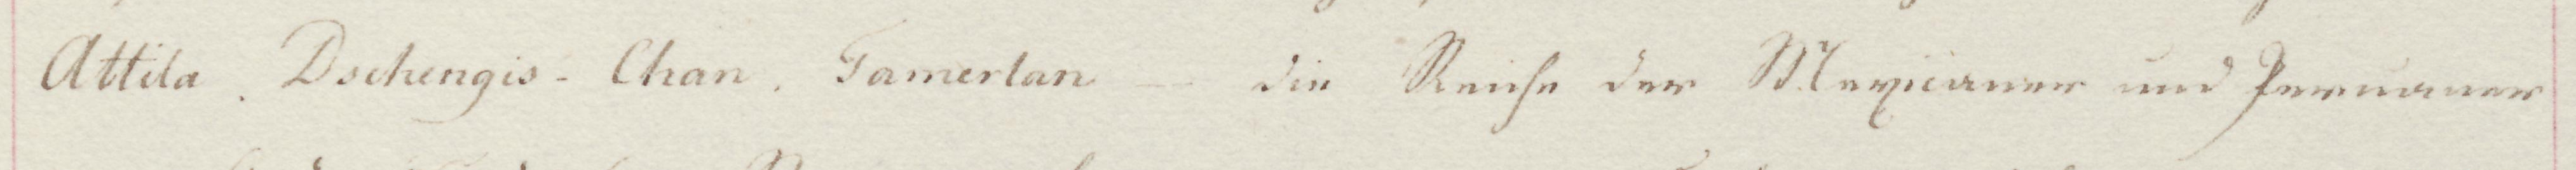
Attila, Dschengis-Chan, Tamerlan – die Reiche der Mexicaner und Peruaner
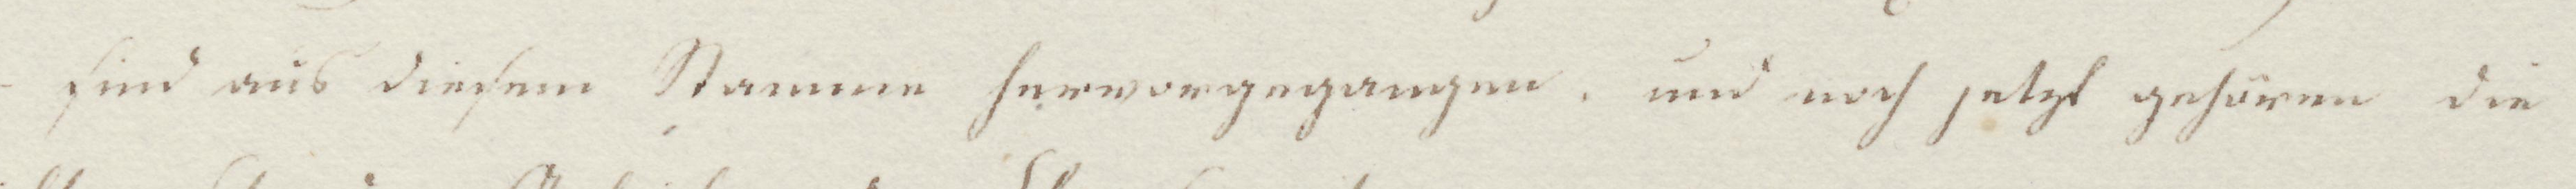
sind aus diesem Stamme hervorgegangen, und noch jetzt gehören die
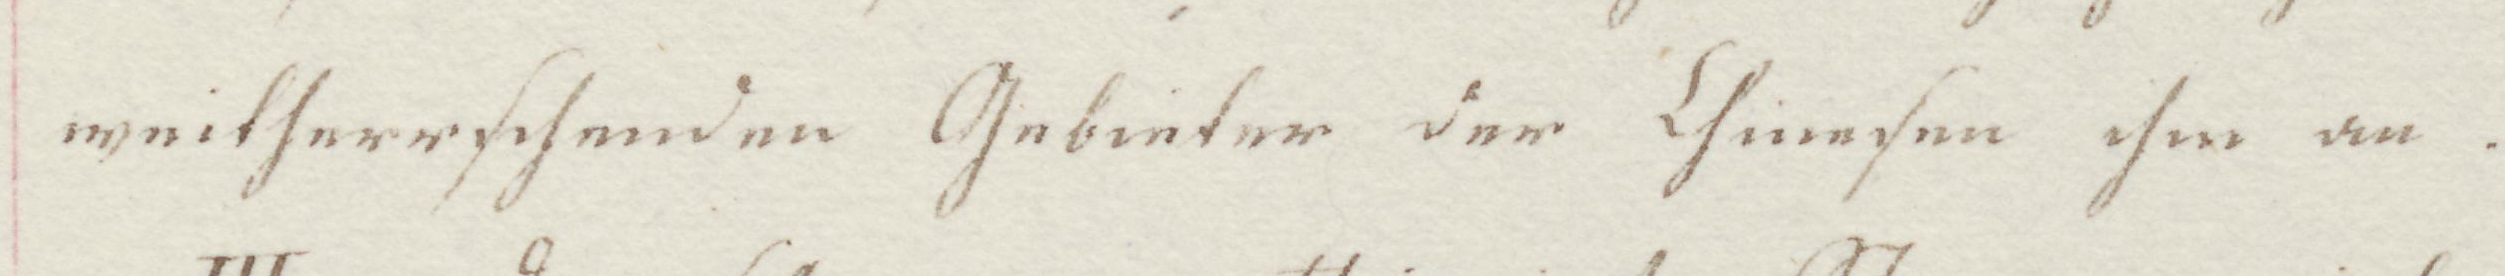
weitherrschenden Gebieter der Chinesen ihm an.
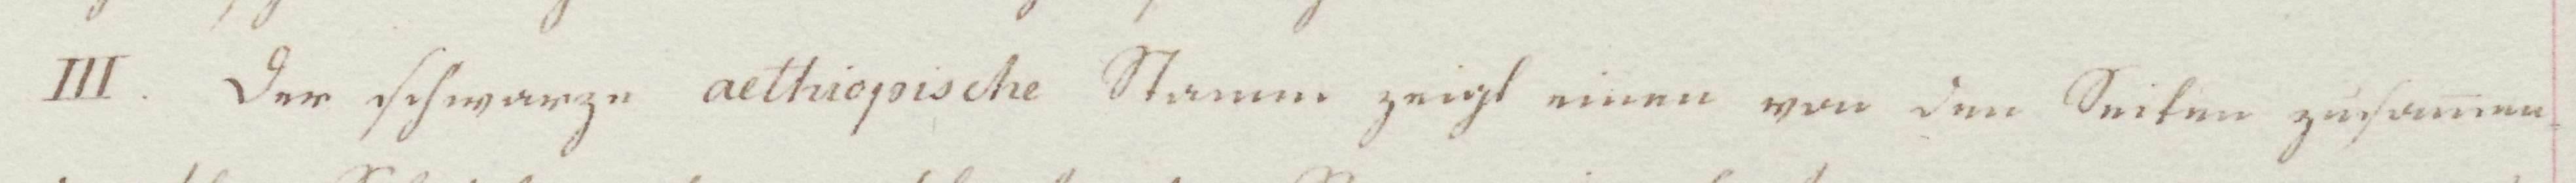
III. Der schwarze aethiopische Stamm zeigt einen von den Seiten zusam̃en-
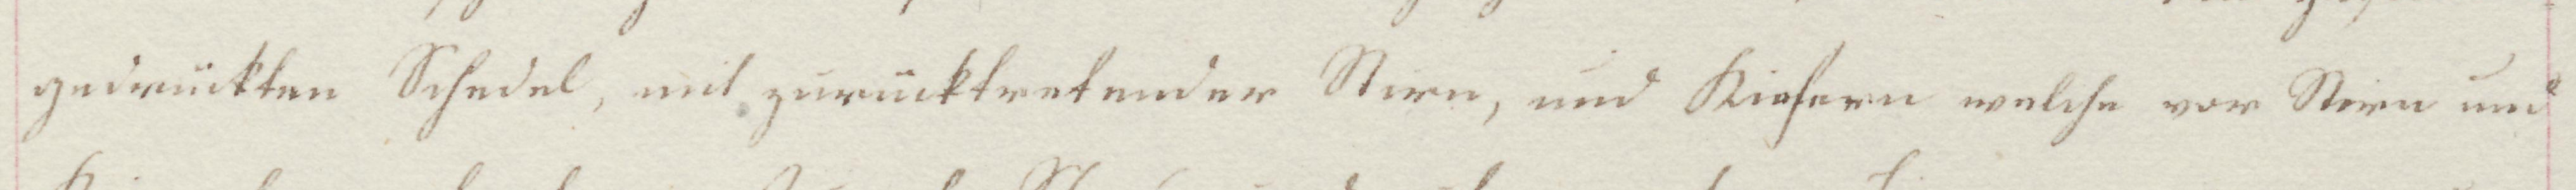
gedrückten Schedel, mit zurücktretender Stirn, und Kiefern welche vor Stirn und
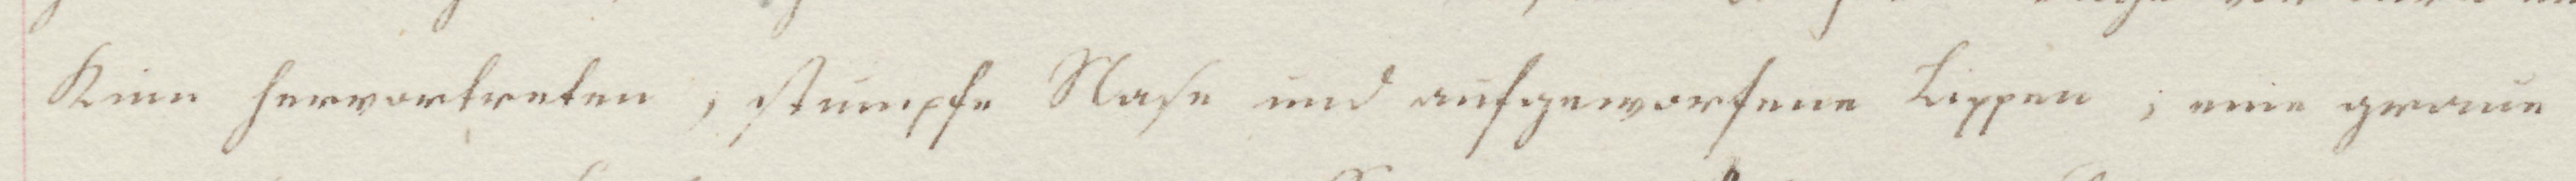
Kinn hervortreten, stumpfe Nase und aufgeworfene Lippen, eine graue
